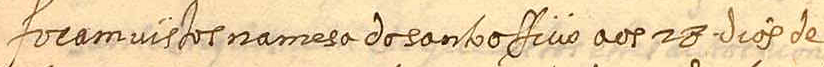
foram vistos na mesa do santo officio aos 28 dias de
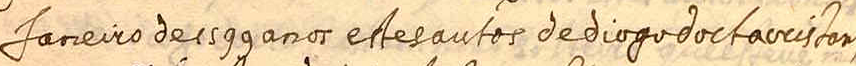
Janeiro de 1599 anos estes autos de diogo dorta cristans
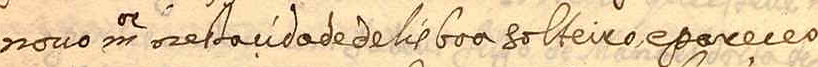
novo mor nesta çidade de lisboa solteiro, e pareçeo
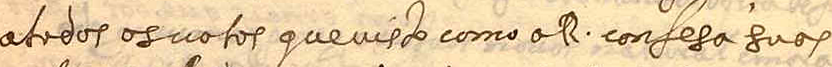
a todos os votos que visto como o R. confesa suas
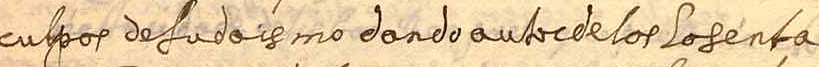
culpas de Judaismo dando autos delas e asenta
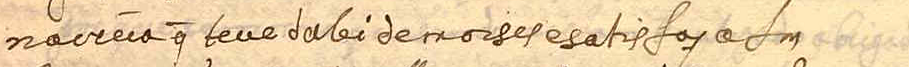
na crēca q̄ teve da lei de moises satisfaz a Jm
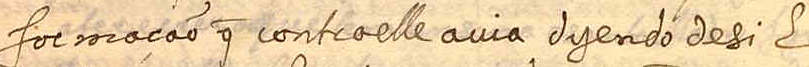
formaçaõ q̄ contra elle avia dizendo de si e
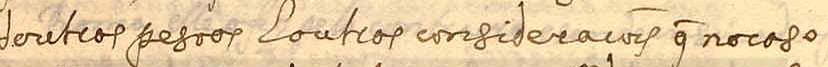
doutras pesoas e outras consideraçõis q̄ no caso
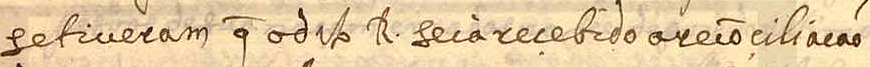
se tiveram q̄ o dito R. seia reçebido a recōçiliacaõ
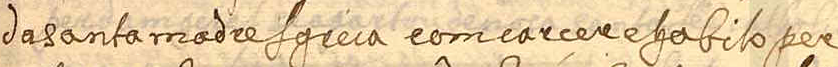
da santa madre Jgreia com carçere e habito per
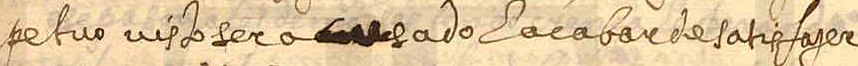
petuo visto ser acusado e acabar de satisfazer
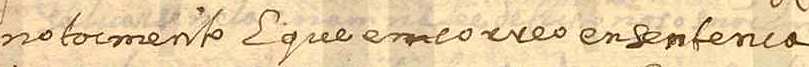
no tormento e que emcorreo en sentenca
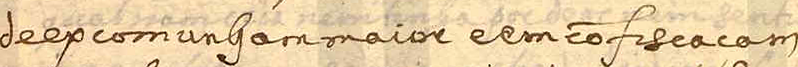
de excomunham maior e em cōfiscaçam
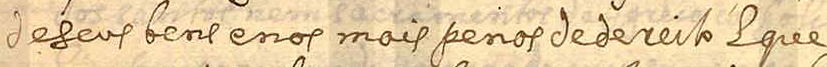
de seus bens e nas mais penas de dereito e que
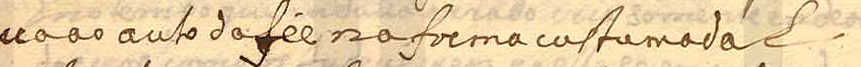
va ao auto da fée na forma custumada e
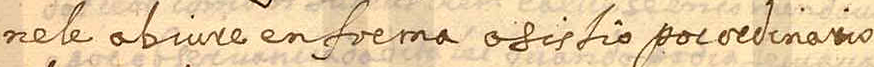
nele abiure en forma asistio por ordinario
